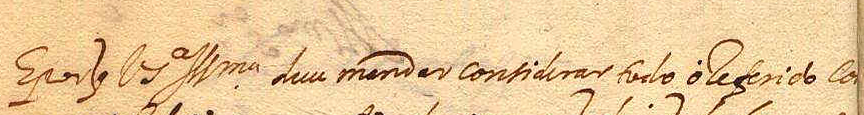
E porq̄ V sa Jll.ma deue mandar considerar todo o Referido co
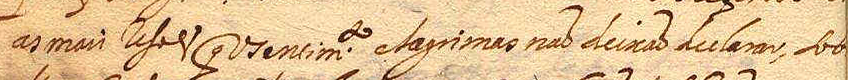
as mais Resoẽs q̄ o sentim.to e lagrimas naõ deixaõ declarar, sob
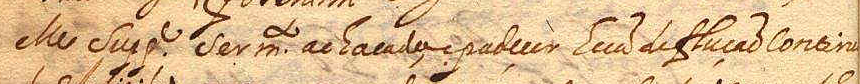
elle Supp.e ser m.to achacado, e padecer huā defluçaõ continu
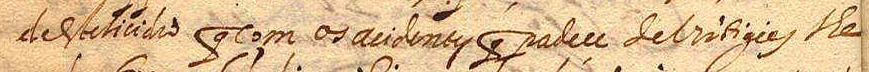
de estelicidio q̄ com os acidentes q̄ padece de Virtigies lhe
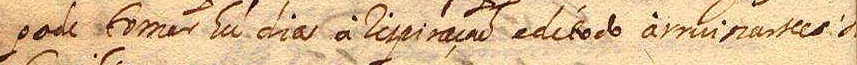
pode tomar hū dia a Respiraçaõ e de todo arruinar sua
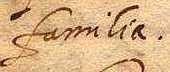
familia.
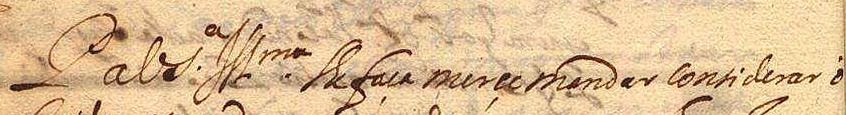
P a V S.a Jll.ma lhe faça merce mandar considerar o
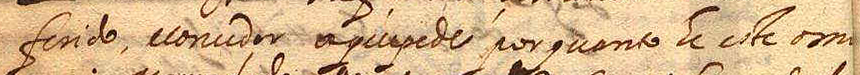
ferido, e conceder o que pede porquanto he este o m
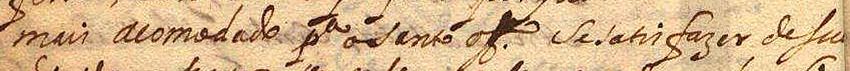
mais acomodado pa o santo off.o se satisfazer de su
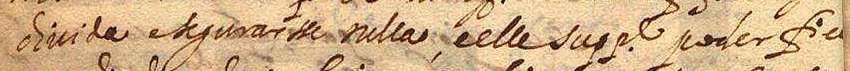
diuida e segurarsse nella e elle supp.e poder fic
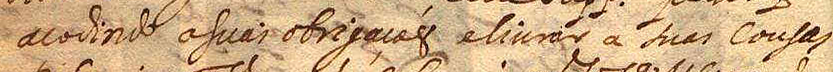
acodindo a suas obrigaçoẽs, e liurar a suas cousas
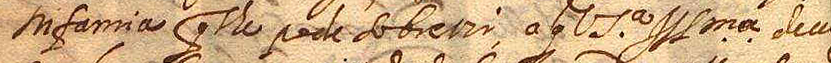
infamia q̄ lhe pode sobrevir, o q̄ V S.a Jll.ma deu
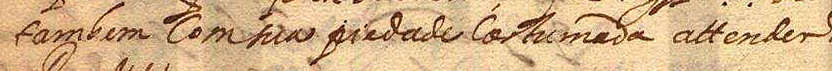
tambem com sua piedade costumada attender
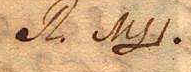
R. Mꝭ.
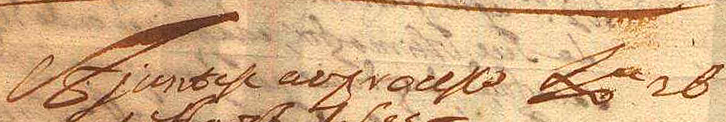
Ajuntesse ao processo Lxa 26
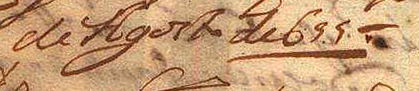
de Agosto de 655.
